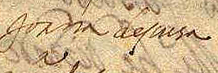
joana de sousa
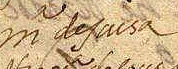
ma de sousa
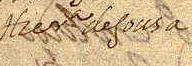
Hiera de sousa
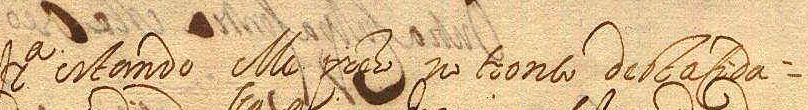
fra estando elle prezo no tronco desta Cida
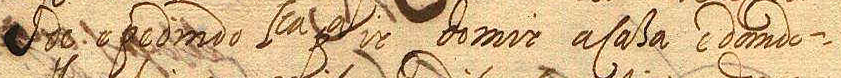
de, e pedindo lca pa ir domir a Caza e dando
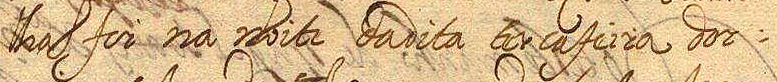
lha foi na noite da dita terca feira dor
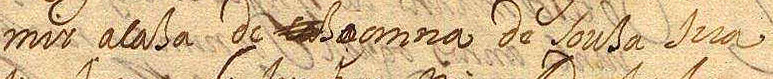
mir a caza de cazoanna de souza sua
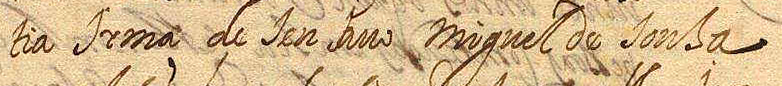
tia Irma de seu auo Miguel de Souza
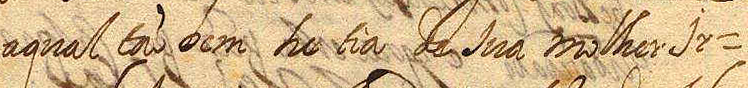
a qual taõ bem he tia de sua molher Ir
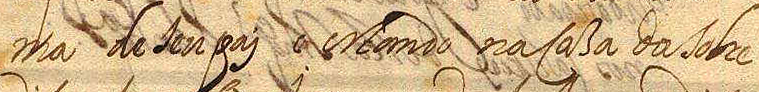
ma de seu paj e estando na Caza da sobre
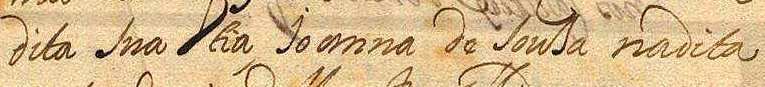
dita sua tia Ioanna de Souza na dita
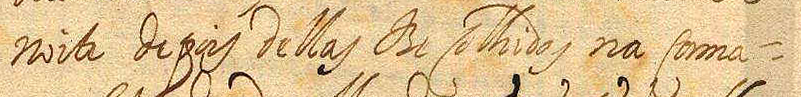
noite depois dellas ReColhidas na Cama
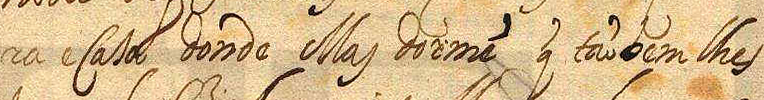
ra e Casa donde ellas dormē q̄ taõbem lhes
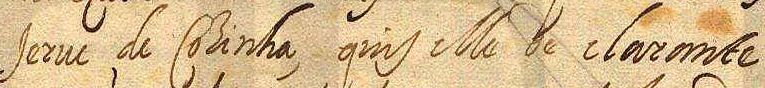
serue de Cozinha, quis elle declarante
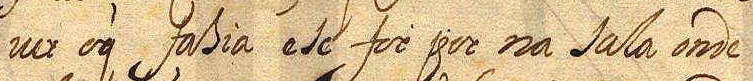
uer o q̄ fazia e se foi por na sala onde
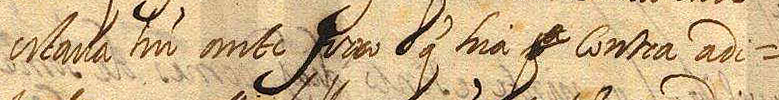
estaua hū ante forro q̄ hia pa contra a di
